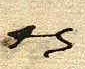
45
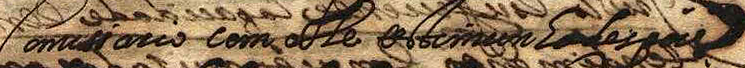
Comissario com elle testemunha despoes
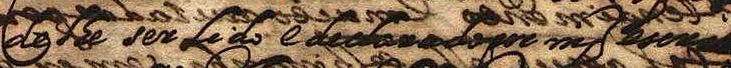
de lhe ser Lido e declarado por mī escri
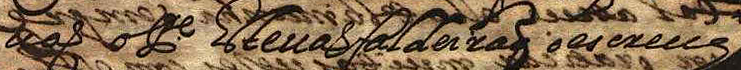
uaõ o P.e Esteuaõ Caldeira q̄ o escreuj
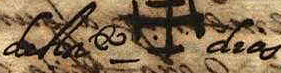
de Anto + dias
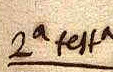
2a testa
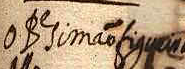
O P.e Simaõ figueira
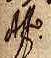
Aff.o
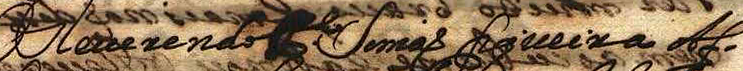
O Reuerendo P.e Simaõ figueira Af
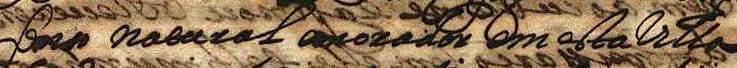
fonso natural e morador em esta Villa
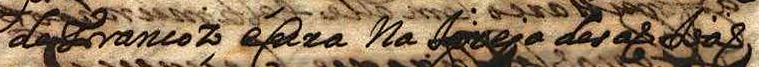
de Trancozo, e Cura Na Igreja de saõ Ioaõ
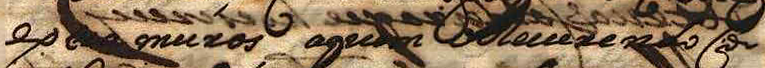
extra muros a quem o Reuerendo Co
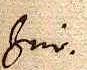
Jur.o
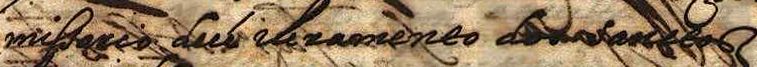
missario deu iuramento dos Santos
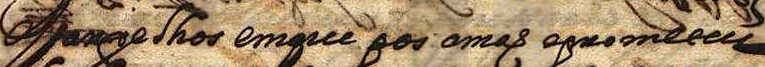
evangelhos em que pos a maõ e prometeu
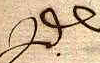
Jd.e
